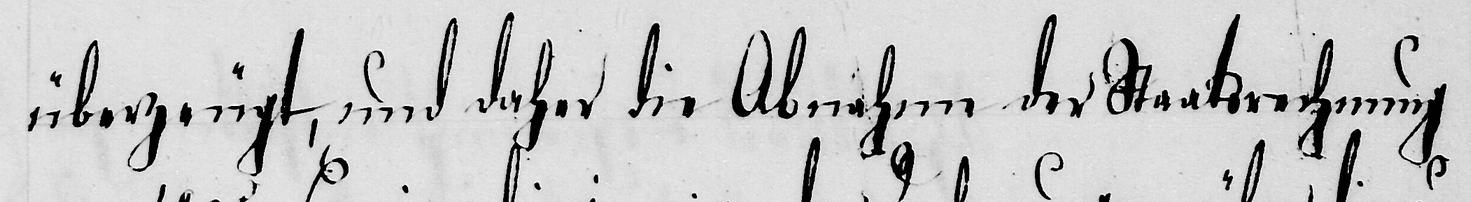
überzeugt, und daher die Abnahme der Staatsrechnung
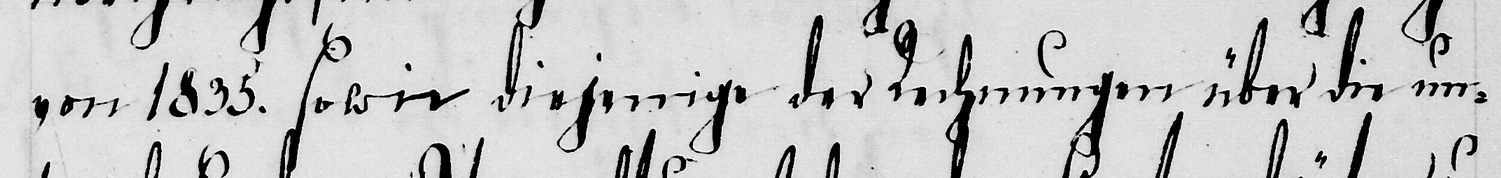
von 1835. sowie diejenige der Rechnungen über die un¬
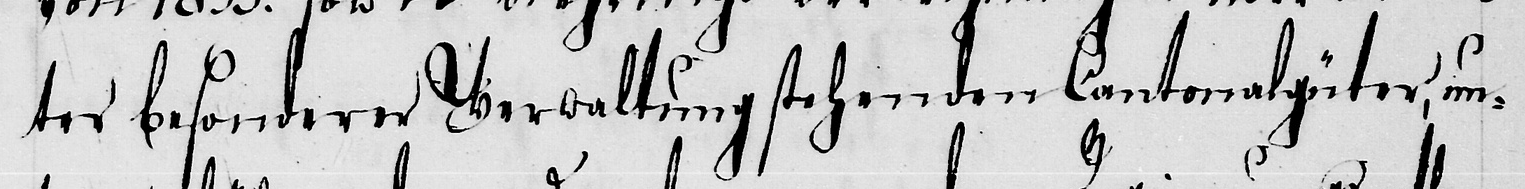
ter besonderer Verwaltung stehenden Cantonalgüter, un¬
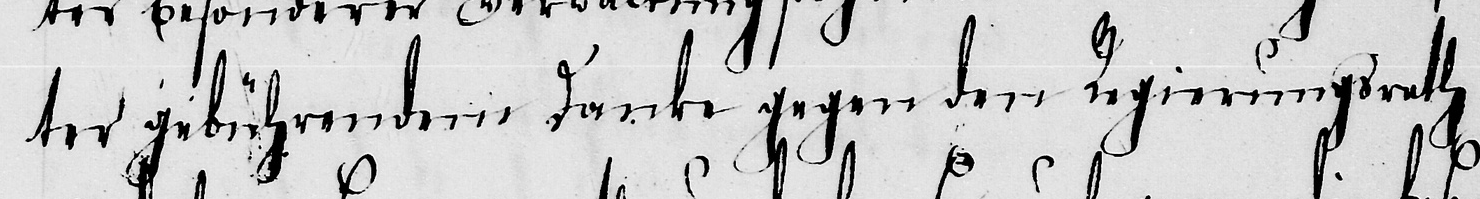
ter gebührenden Danke gegen den Regierungsrath
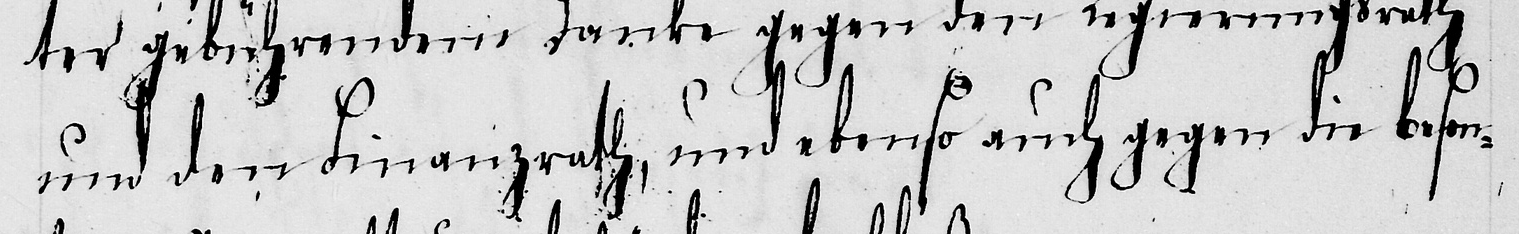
und den Finanzrath, und ebenso auch gegen die beso¬
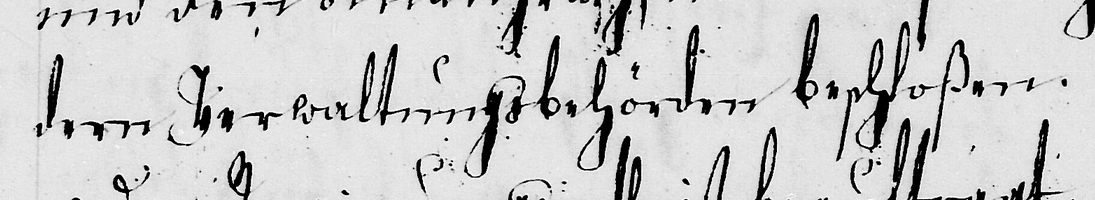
ndern Verwaltungsbehörden beschloßen.
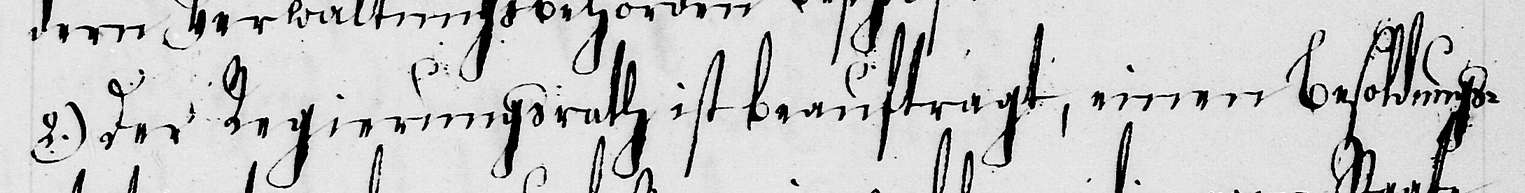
2.) Der Regierungsrath ist beauftragt, einen Besoldung¬
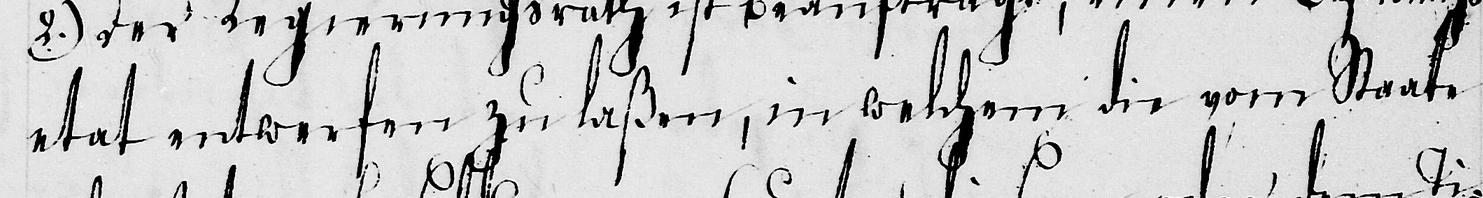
setat entwerfen zu laßen, in welchem die vom Staate
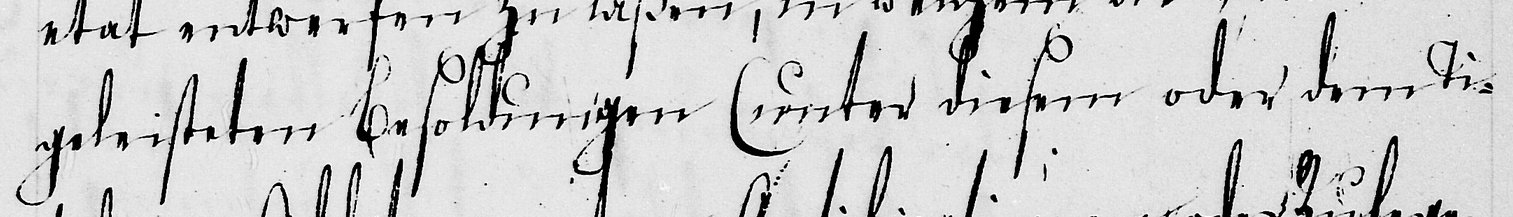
geleisteten Besoldungen (unter diesem oder dem Ti¬
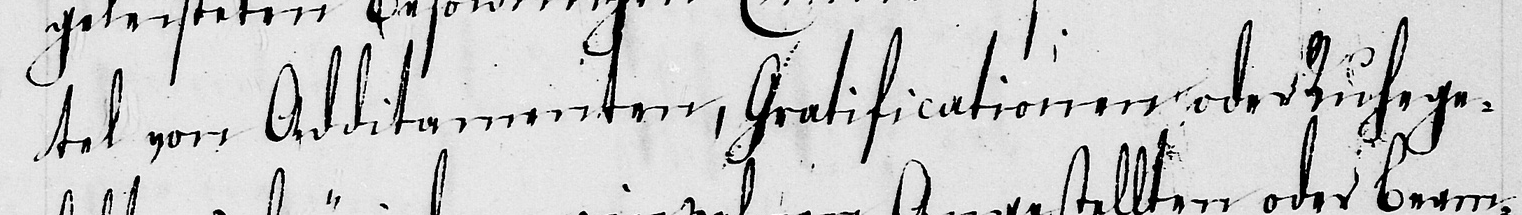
tel von Additamenten, Gratificationen oder Ruhege¬
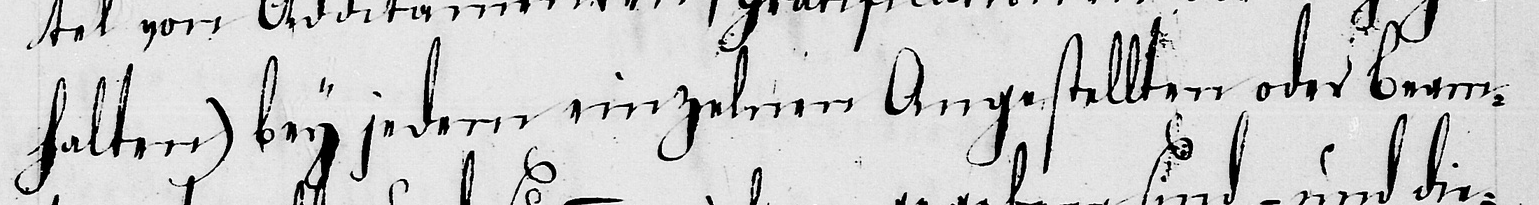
halten) bey jedem einzelnen Angestellten oder Beam¬
